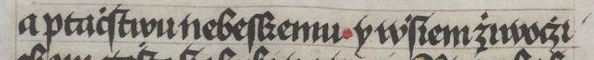a ptaċſtwu nebeſkemu.y wẛíem żiwoċzi¬
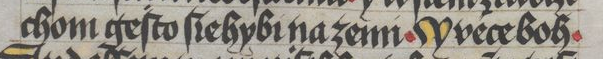chom geẛto ſíehybí na zemí. Y vece boh.
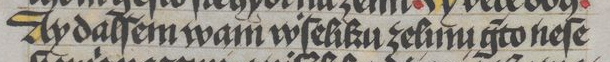Ay dalſem wam wẛeliku zelinu ḡto neſe
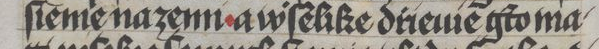ſienié na zemí.a wẛélike dṙíeuíe ḡto ma¬
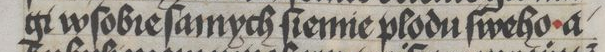gí wſobieſamych ſiemíe plodu ſweho.a¬
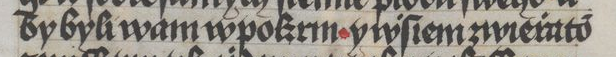by bylí wam wpokrm. y wẛiem zwieṙatō
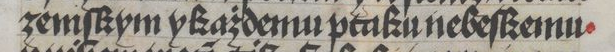zemſkym y każdemu ptaku nebeſkemu.¬
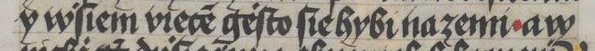y wẛíem viecē geẛto ſie hybi na zemí.a w¬
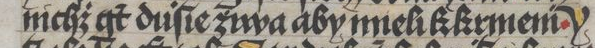nichż ḡt duẛie żiwa aby mieli kkrmení. Y
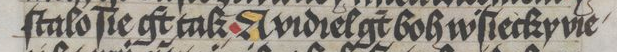ſtalo ſíe ḡt tak. A vidiel ḡt gſi boh wẛíeċky vie¬
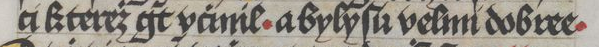cí ktereż ḡt vċíníl.a byly ſu velmí dobree.
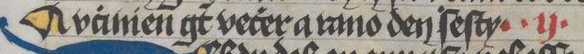A vċiníen ḡt večer a rano den ẛeſty. .ij.
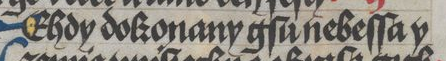Ehdy dokonany gſu nebeſſa y
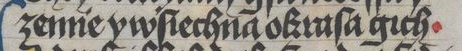zemíe y wẛiechna okraſa gich.
